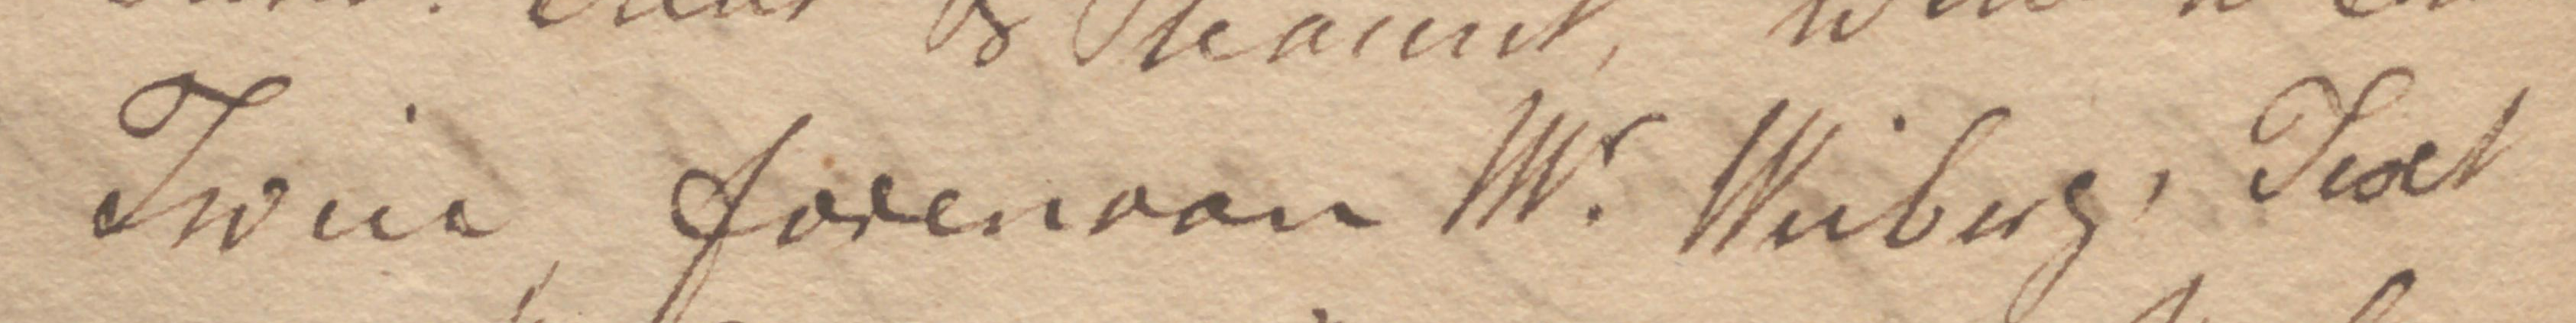Twice forenoon M^r. Weibergs Text
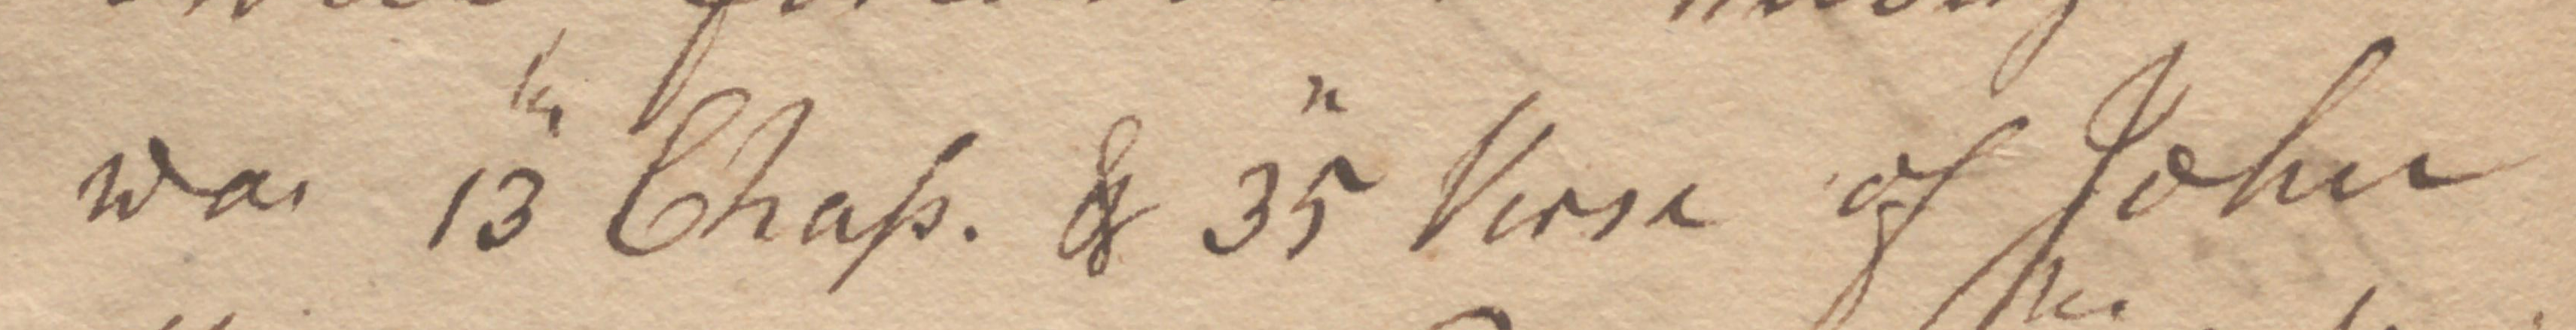was 13 Chap. & 35 Verse of John
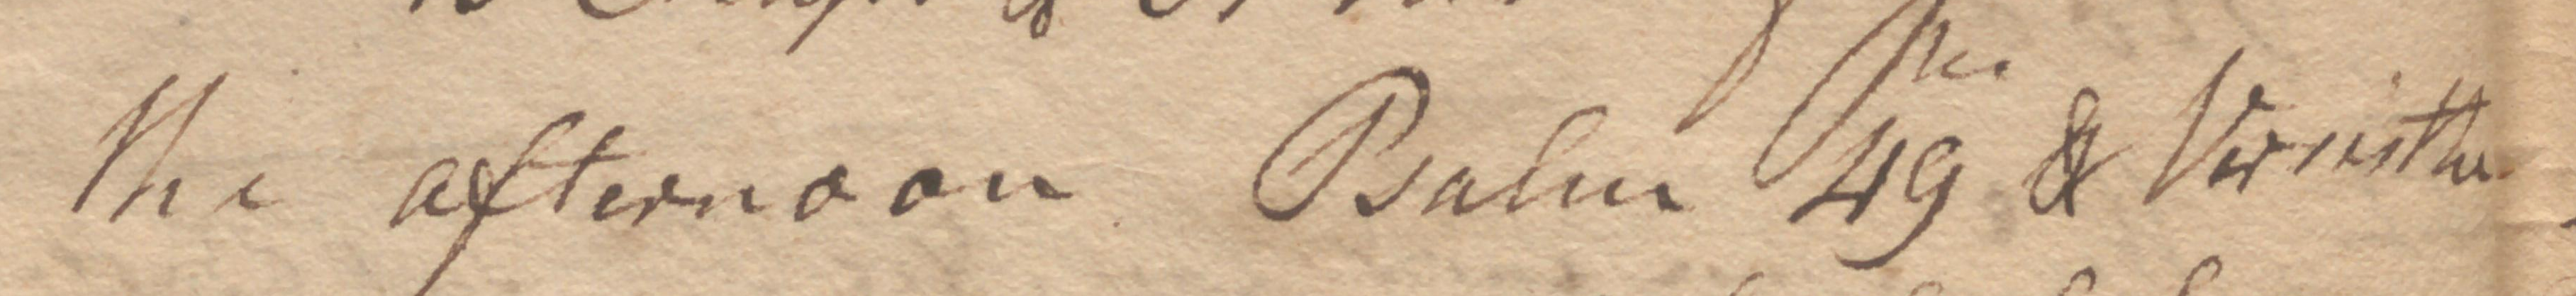the afternoon Psalm 49^th & Veres the
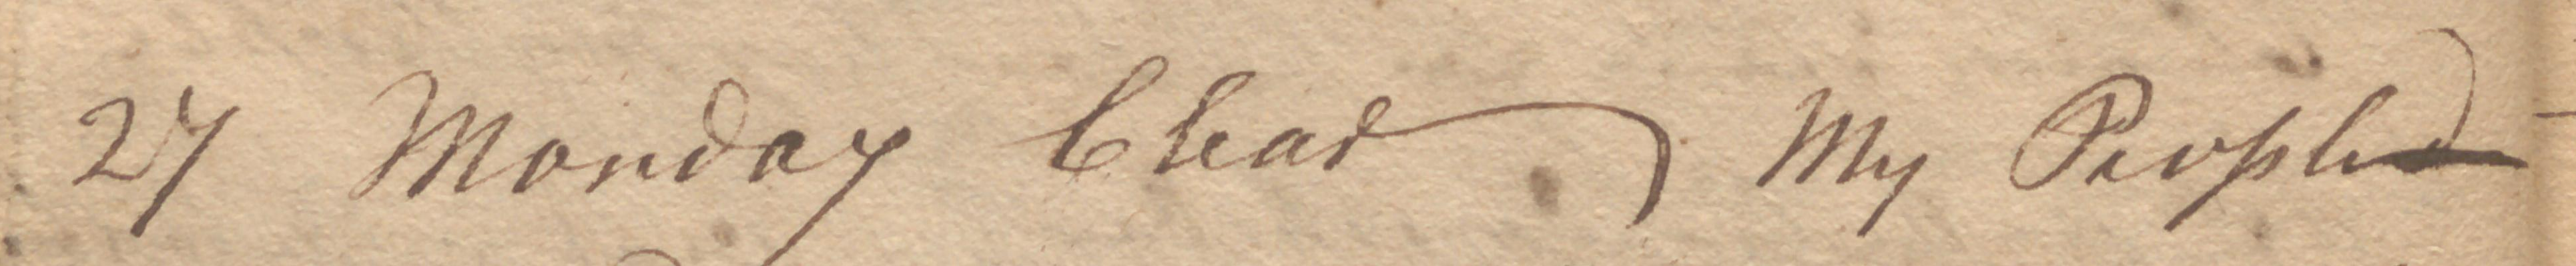27 Monday Clear My People[d]
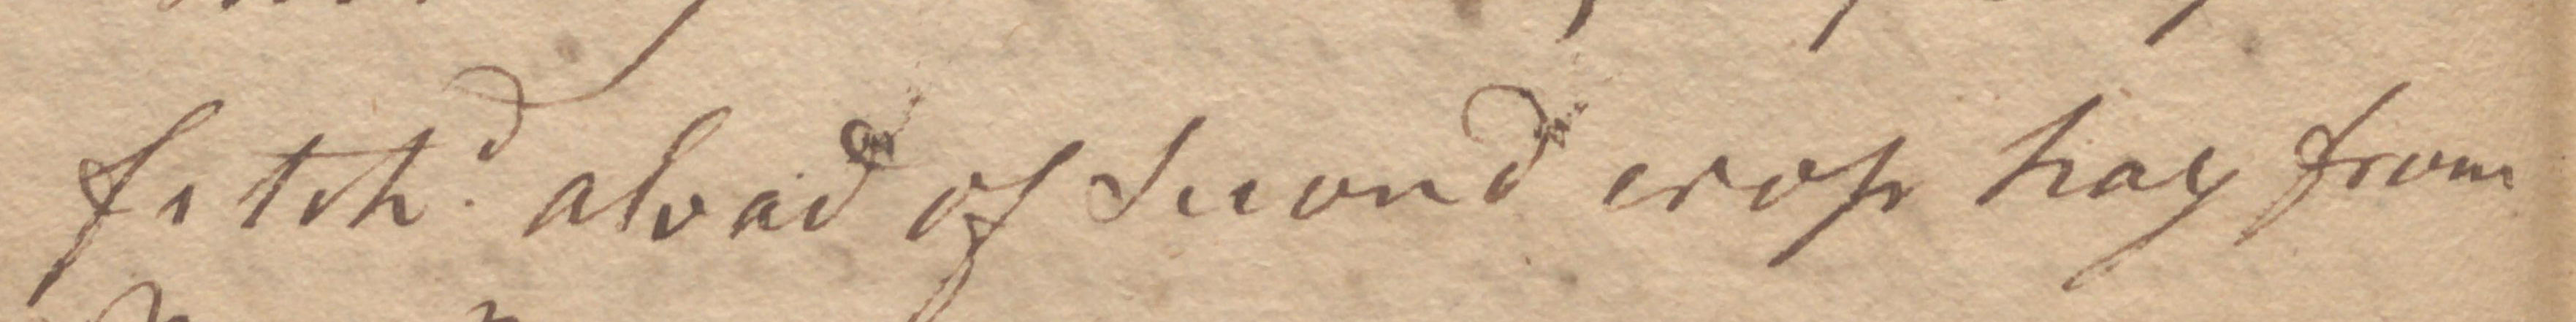fetch^d. a load of second crop hay from
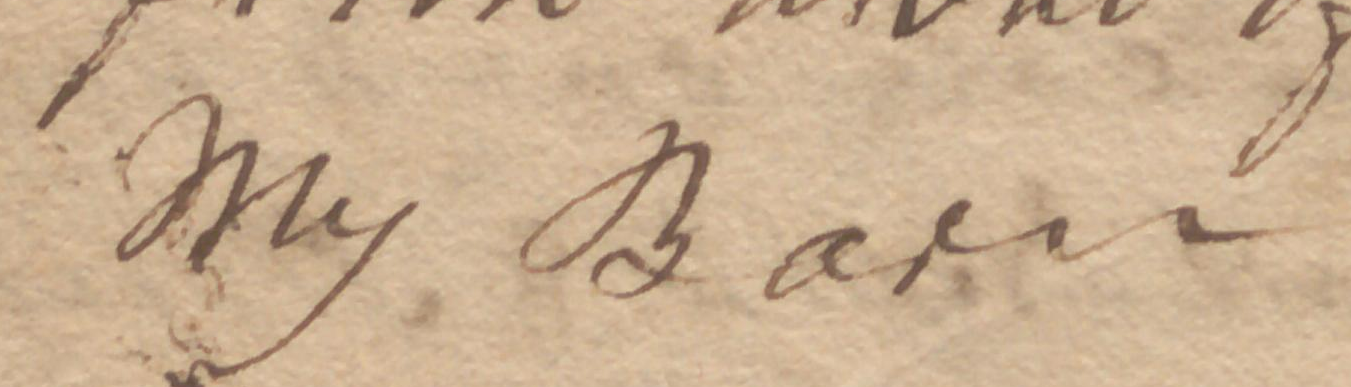My Barn
